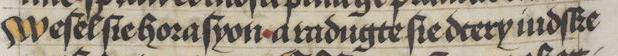Weſel ſie hora ſyon.a radugte ſie dcery íudſke
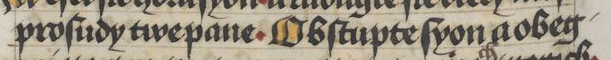proſudy twepane.Obſtupte ſyon k obeg¬
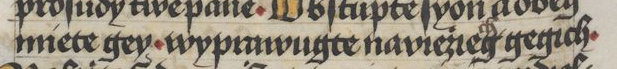míete gey.wyprawugte naviežiegch gegich.
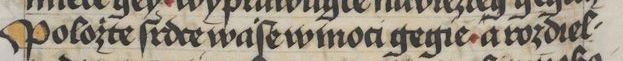Položte ſrdce waẛe w moci gegíe.a rozdiel¬
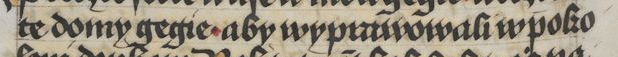te domy gegíe.aby wyprawowali wpoko¬
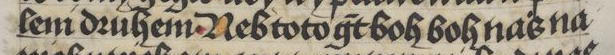lení druhem.Neb toto ḡt boh boh naṡ na
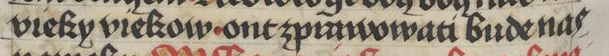vieky viekow.ont zprawowati bude nas
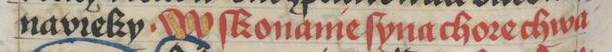navieky.W ſkonaníe ſyna chore chwa¬
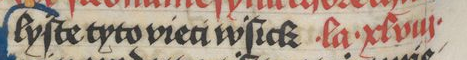lyẛte tyto vieci wẛick.la.xlviij.
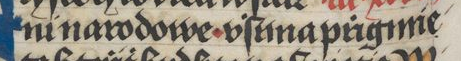ni narodowe.vẛima pṙigmie¬
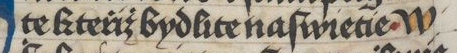te kteṙíž bydlite naſwietie.W¬
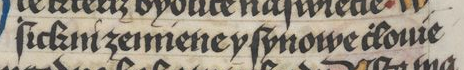ẛickni zemíene y ſynowe člouíe¬
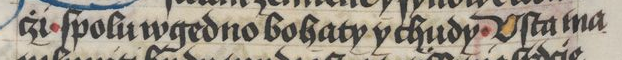cží.ſpolu wgedno bohaty y chudy.Vſta ma
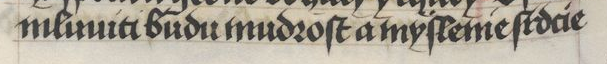mluuíti budu mudroſt a myẛleníe ſrdcie
